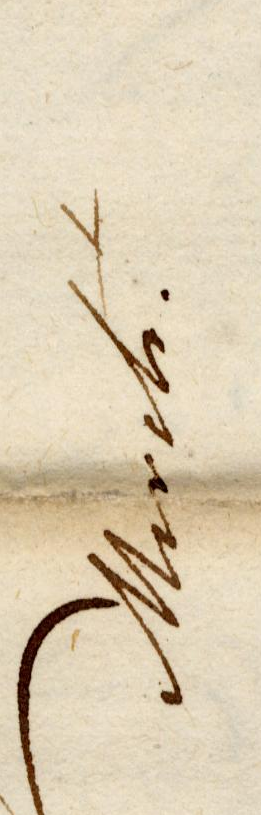Merch^t
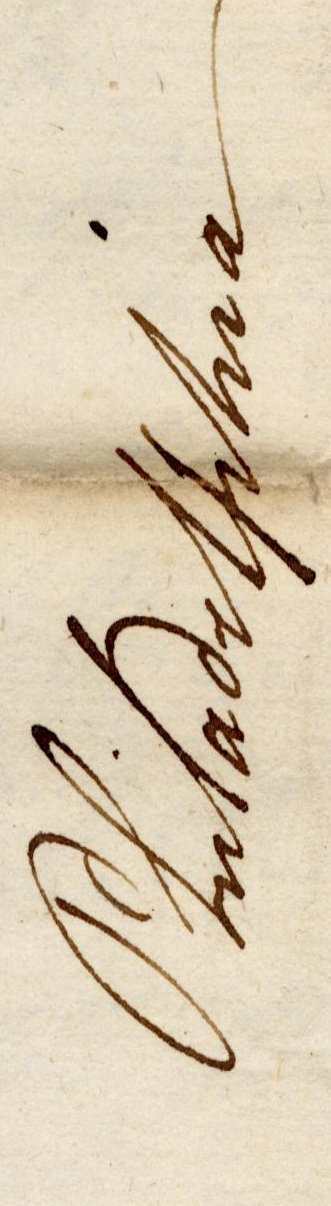Philadelphia
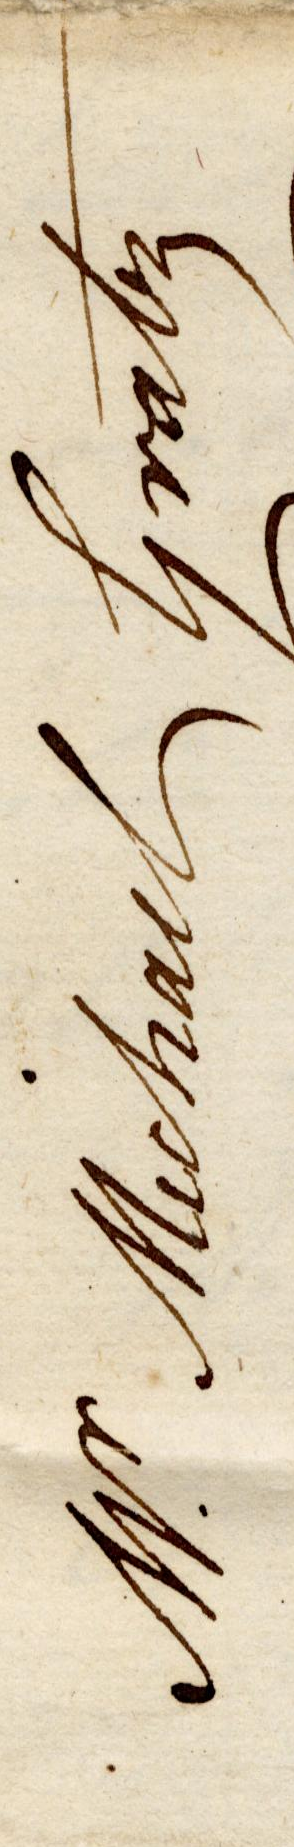M^r Michael Gratz
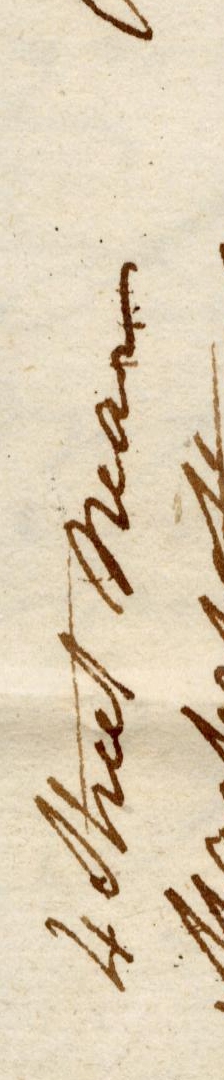4 Street near
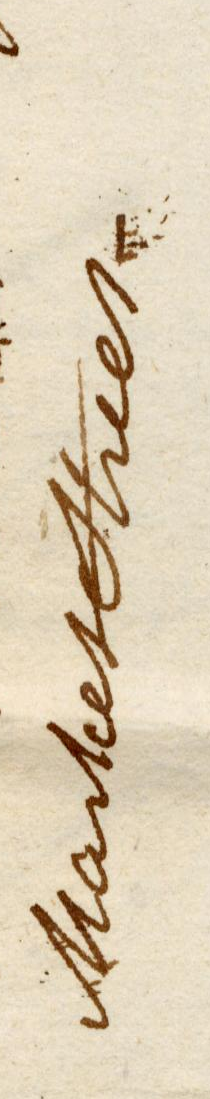Market Street-
